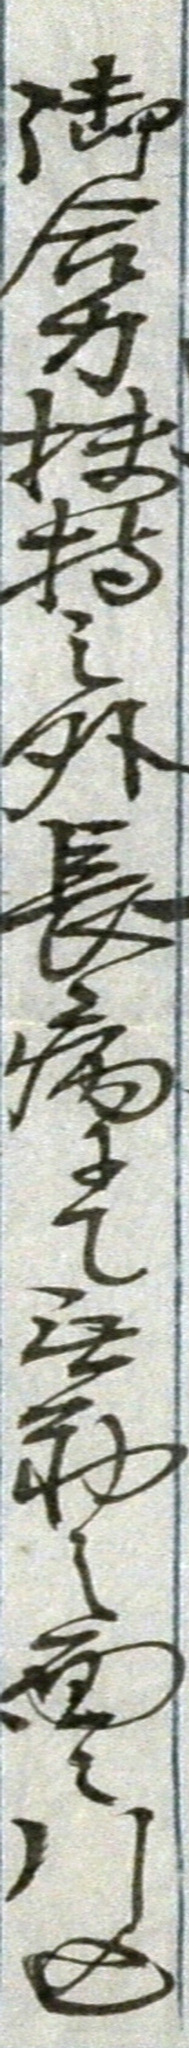一御合力扶持之外長病にて無勤之面々引込
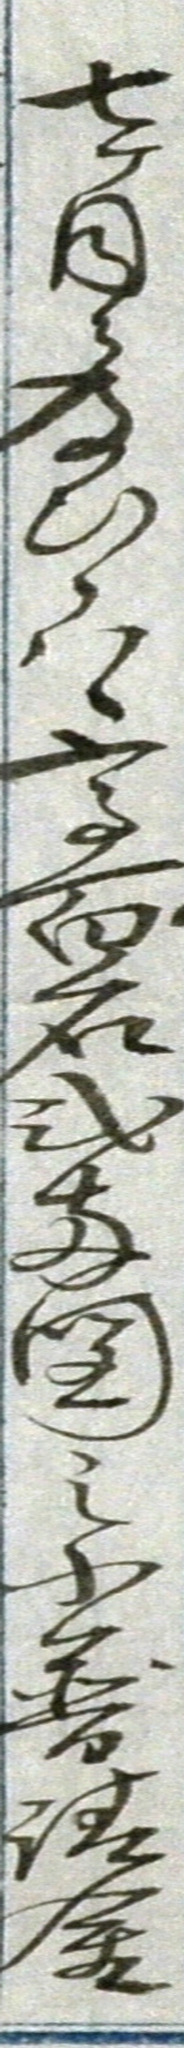七ヶ月に及ひ候はヽ高百石弐両図之小普請金
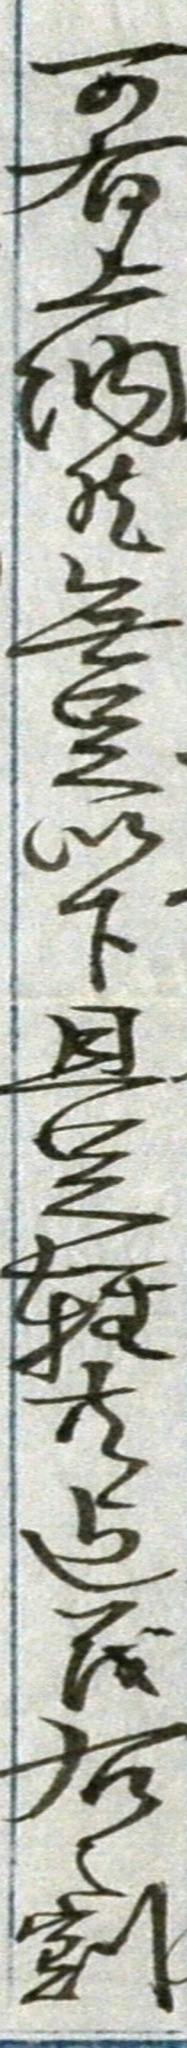可有上納候無足以下且足軽共迄も右之割
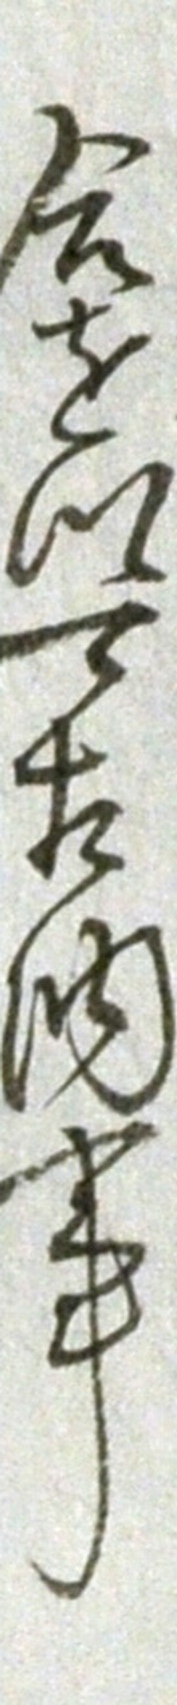合を以可相納事
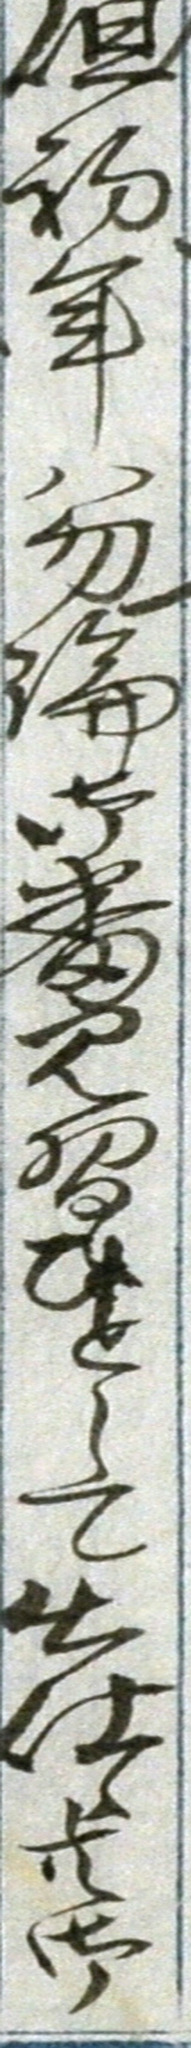但初年は勿論御番見習ひとして出仕候共御
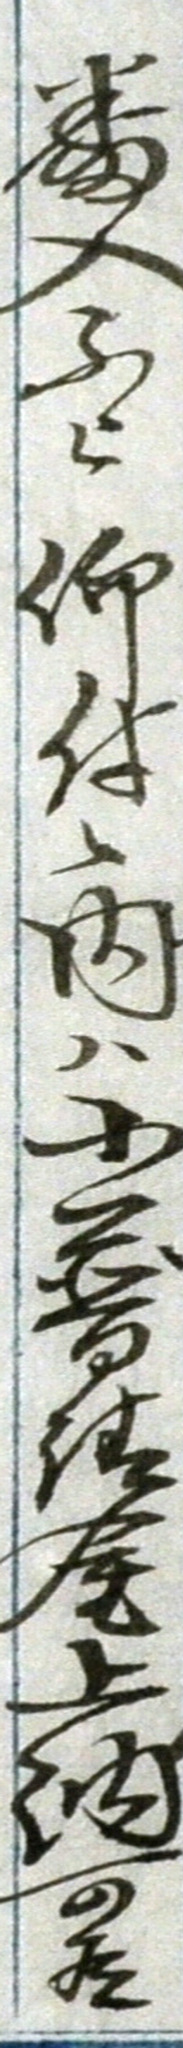番入不仰付候内は小普請金上納可有
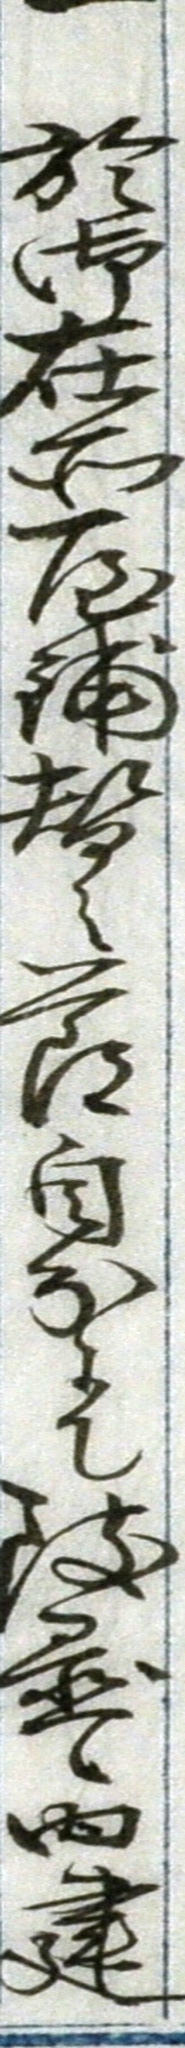一於御在所屋鋪替之節自分にて致置候内建
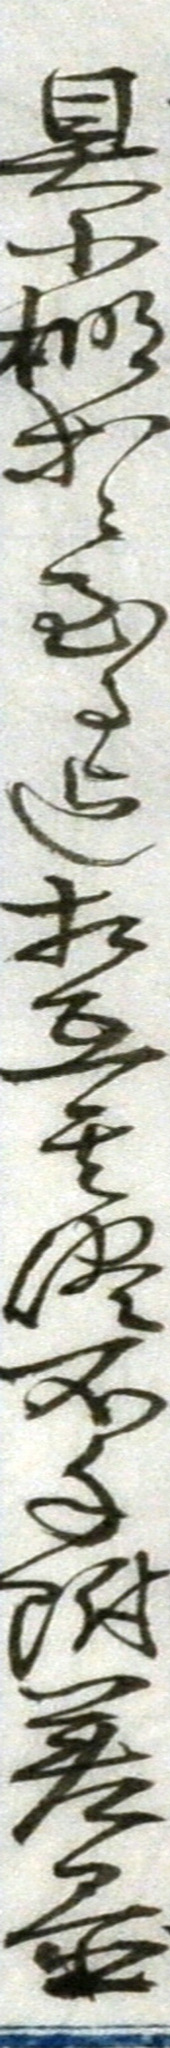具小棚等に至る迄相互其儘不手附差置
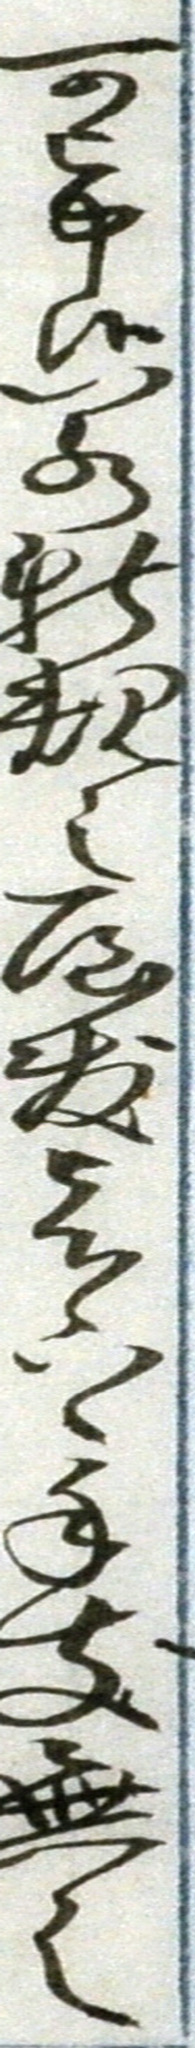可被申候若新規之屋敷被下候はヽ手支無之
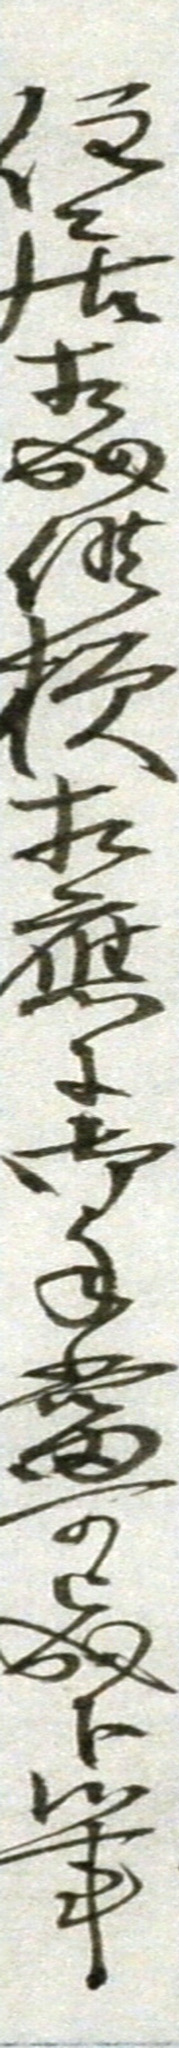住居相成候様相応に御手当可被成下候事
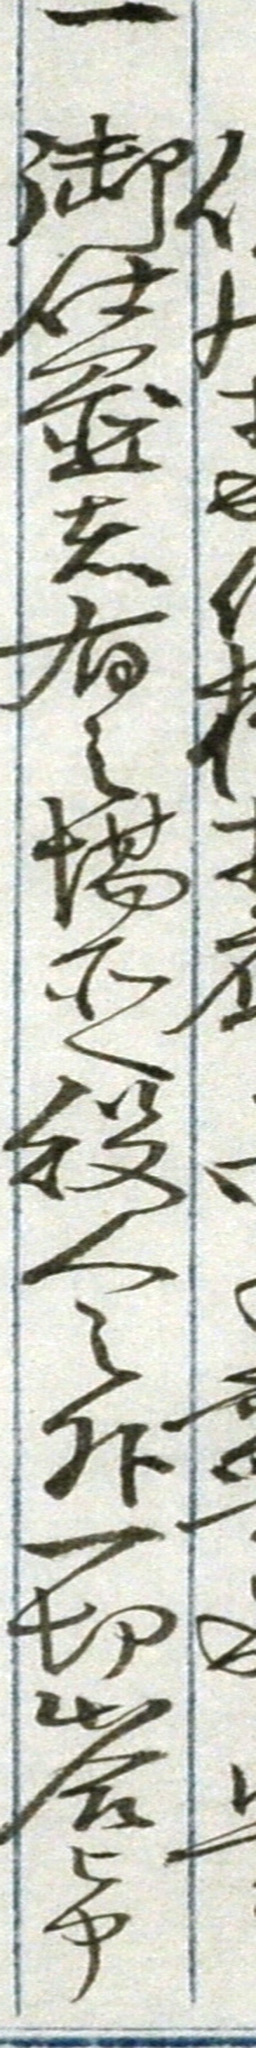一御仕置者有之場所へ役人之外一切出合被申
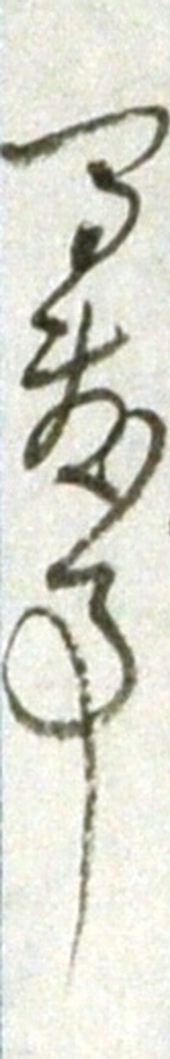間敷事
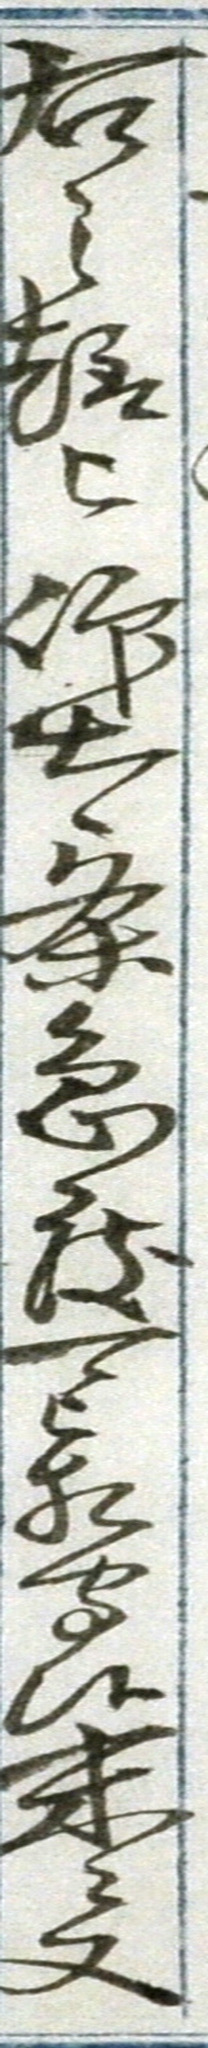右之趣被仰出候条急度可相守候末々又
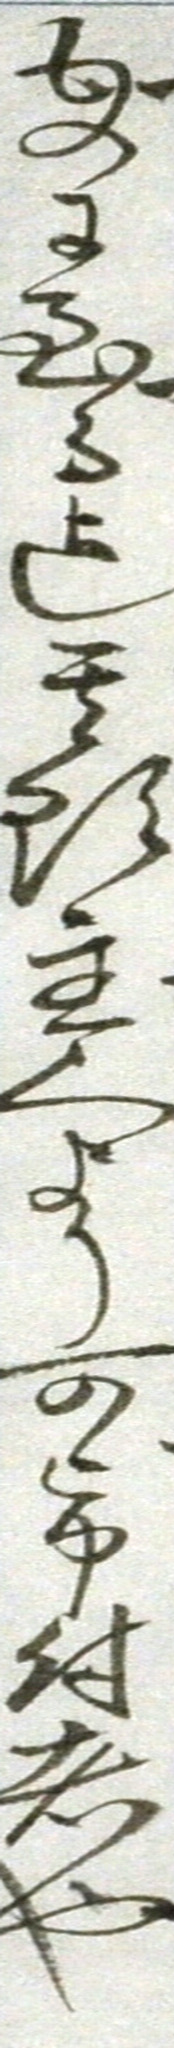ものに至る迄其頭主人より可被申付者也
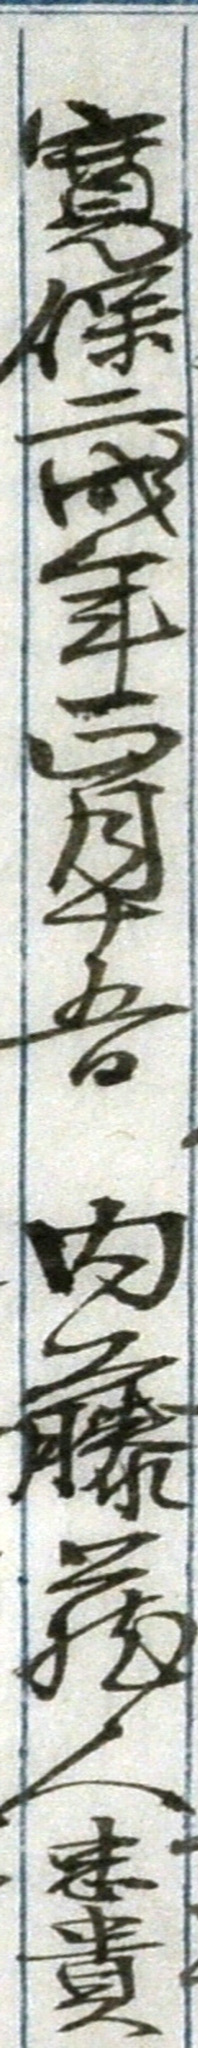寛保二戌年正月十五日内藤蔵人忠貴判
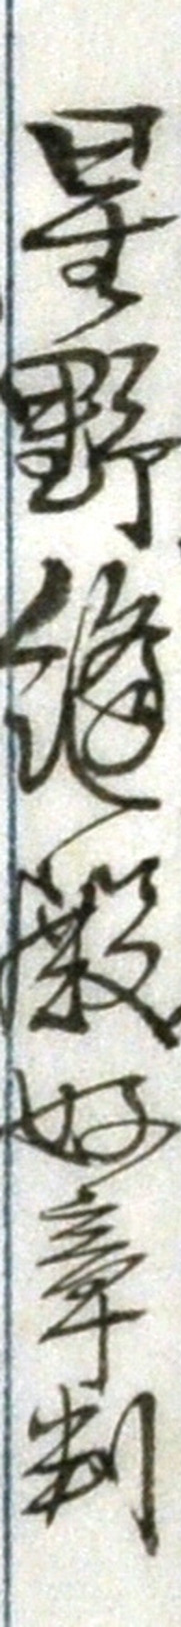星野縫殿好章判
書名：仰書覚
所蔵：伊那市立高遠町図書館・合同会社AMANE
